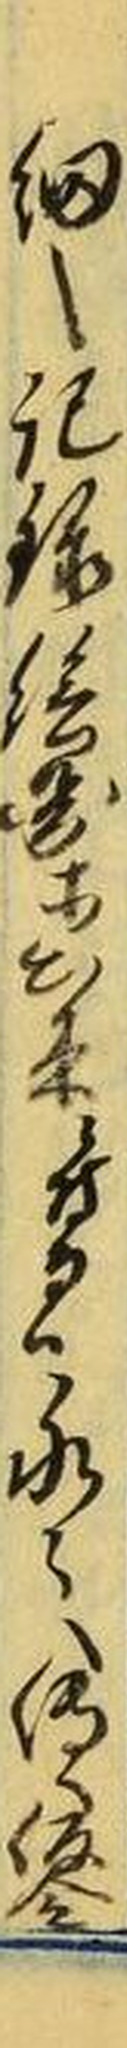細之記録絵図等出来に付而は永々へ伝へ仮令
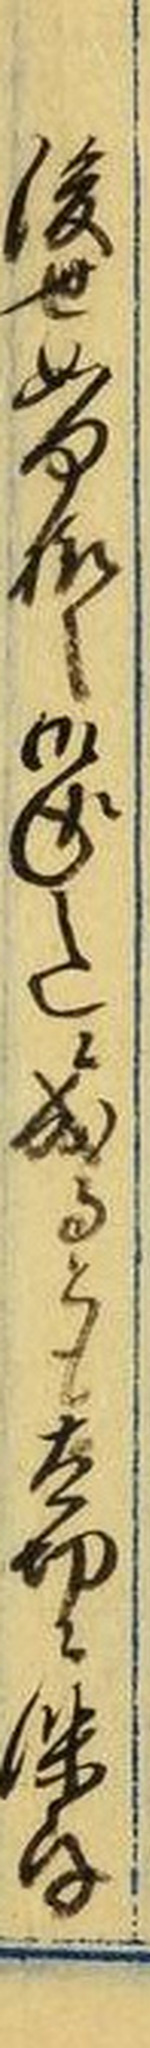後世如何様之御趣意に成るとも太切に保存
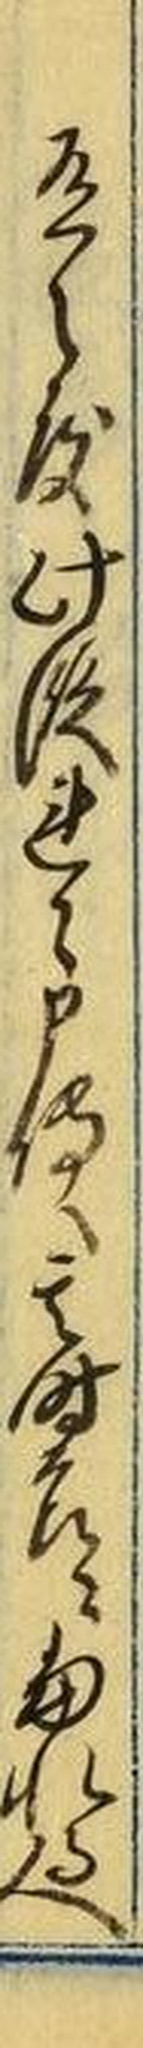有之度此段連々申伝へ其時節に当れる人
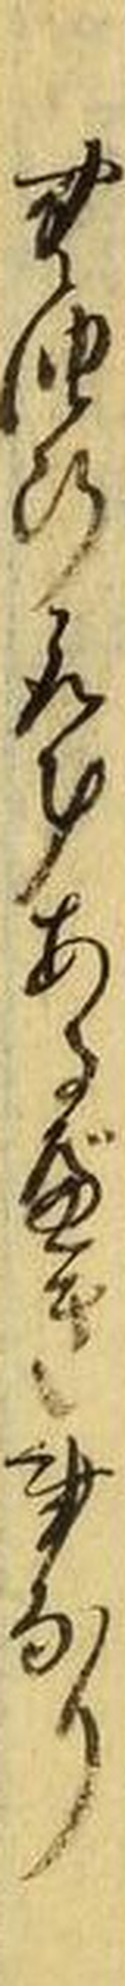無油断取計あるべき事なり

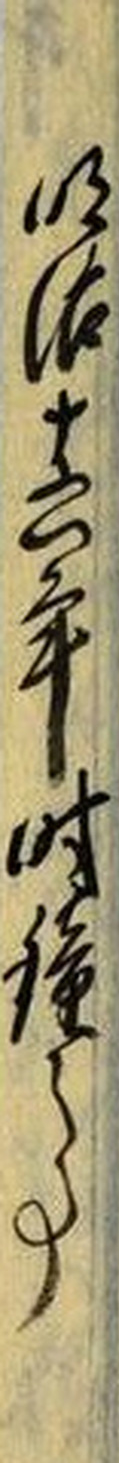明治十六年時鐘之事
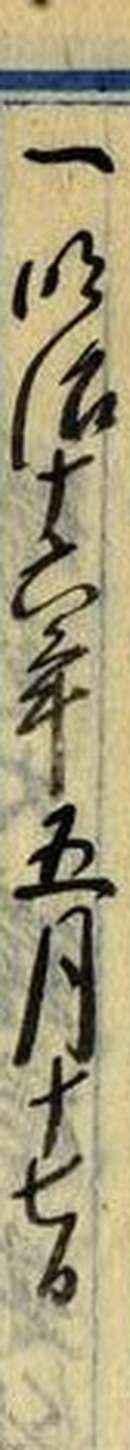一明治十六年五月十七日
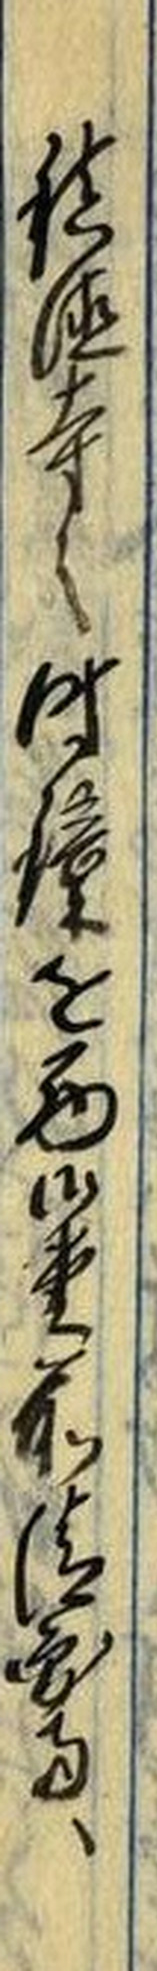鎮徳寺之時鐘を西御堂前清円寺へ
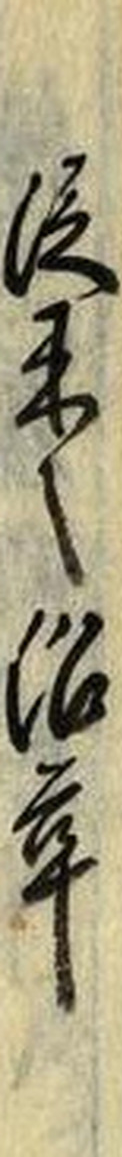従来之沿革
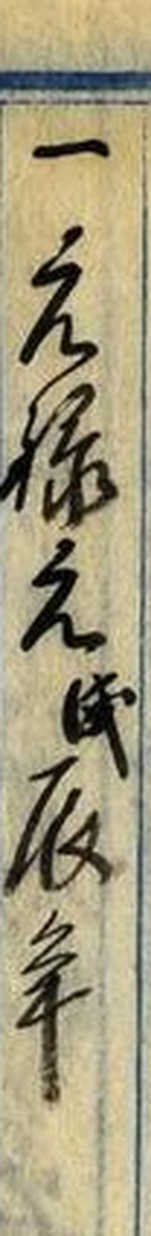一元禄元戊辰年
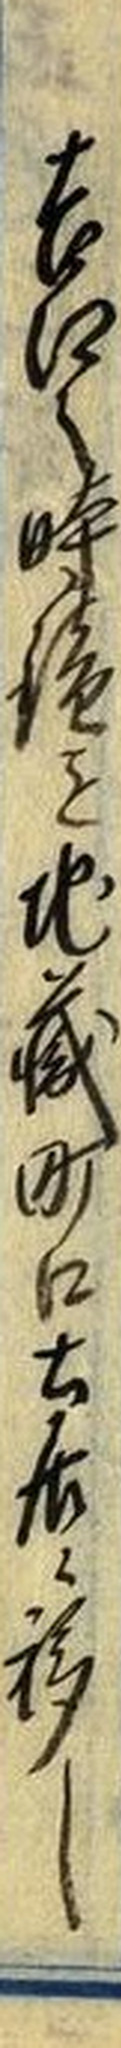吉江之時鐘を地蔵町口土居に移し
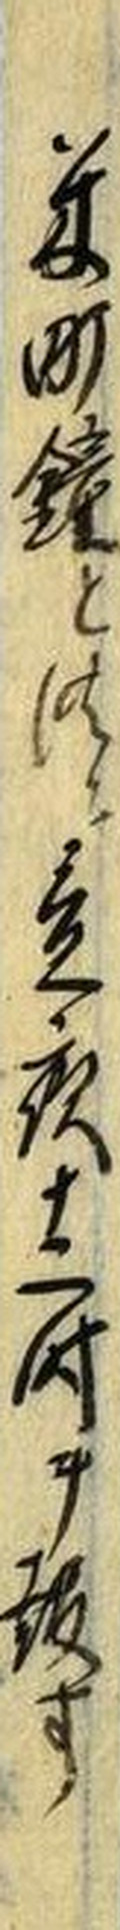米町鐘と供に昼夜十二時を報す
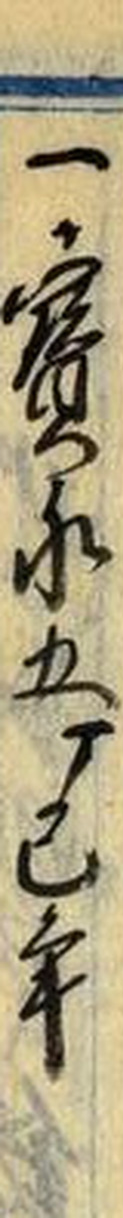一宝永五丁巳年

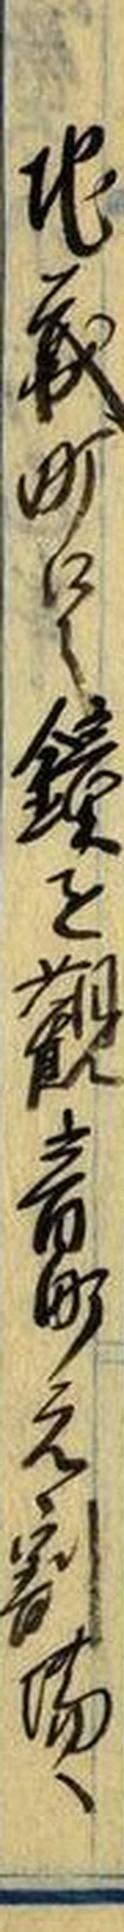地蔵町口之鐘を観音町元割場へ
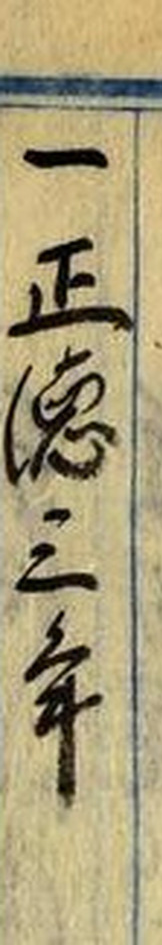一正徳三年
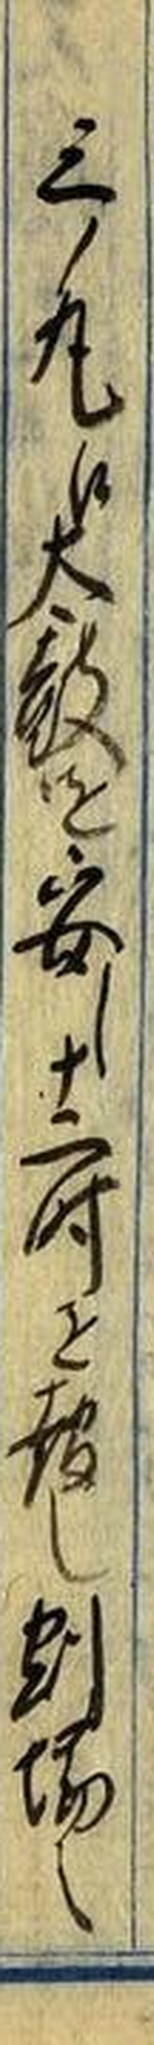三ノ丸え太鼓を安し十二時を報し割場之
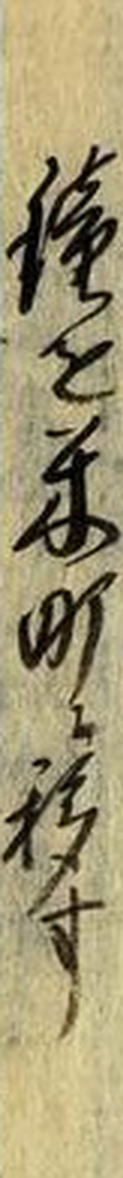鐘を米町に移す
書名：温古集 五巻
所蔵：福井県文書館 Fukui Prefectural Archives
